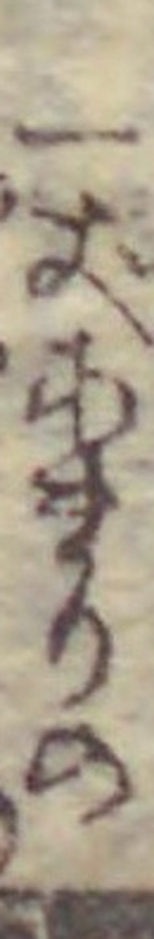一丈あまりの
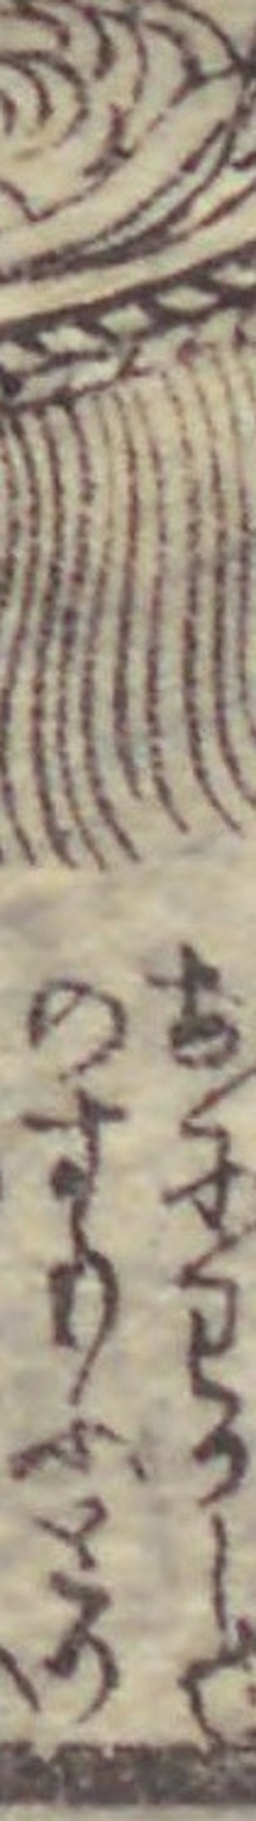のすもふとり
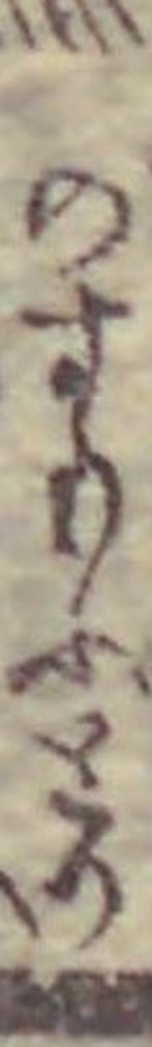のすもふとり
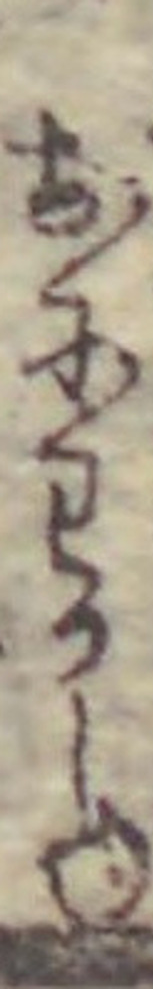おにわかしゆ
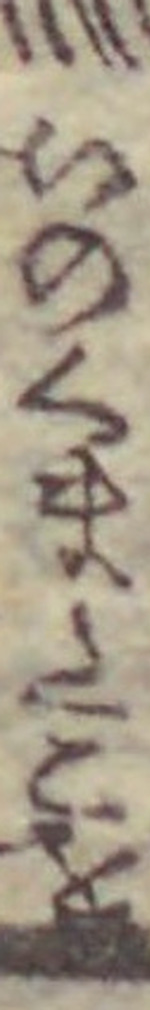いのくまたこを
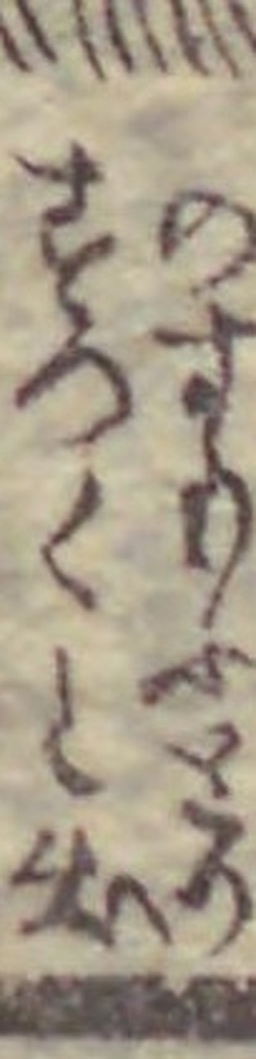すつくと出
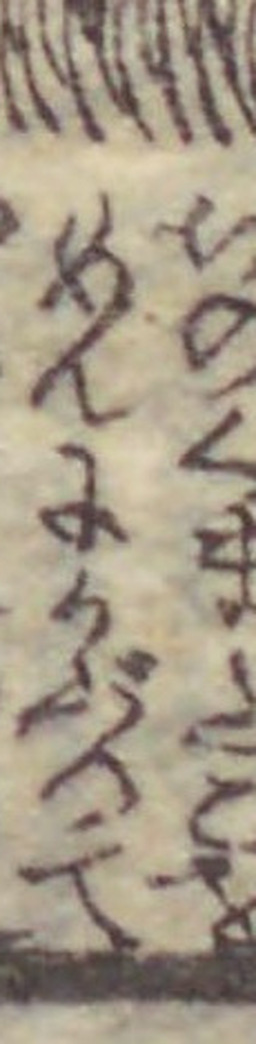めんにかぶつて
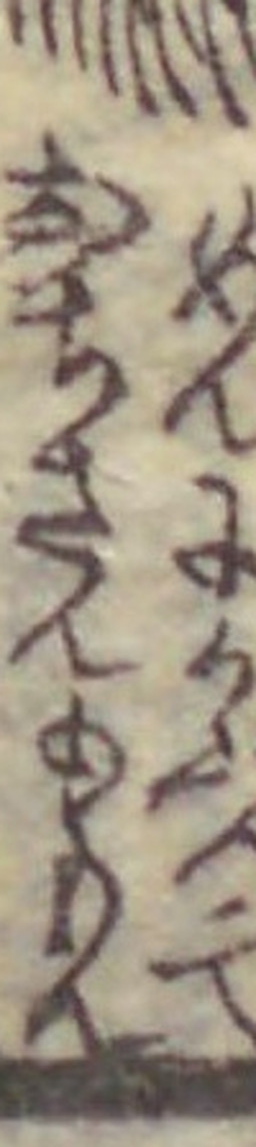おちさんももん
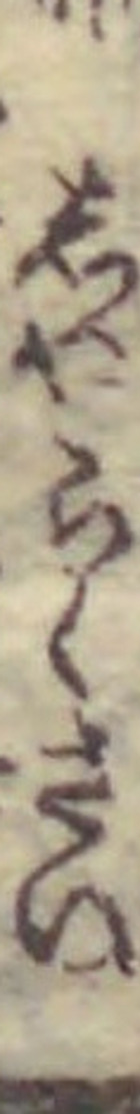しやらくさい
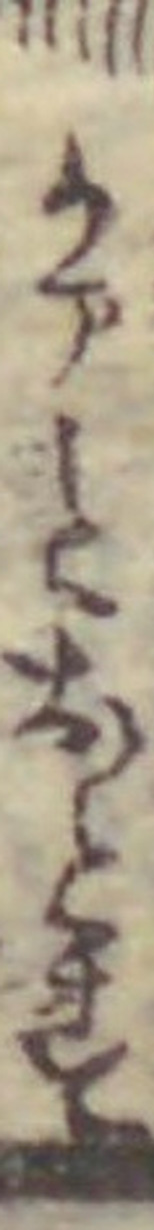かァとおとす
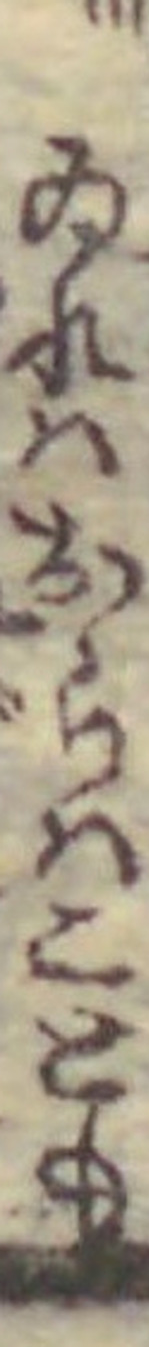ゐれはおらはことも
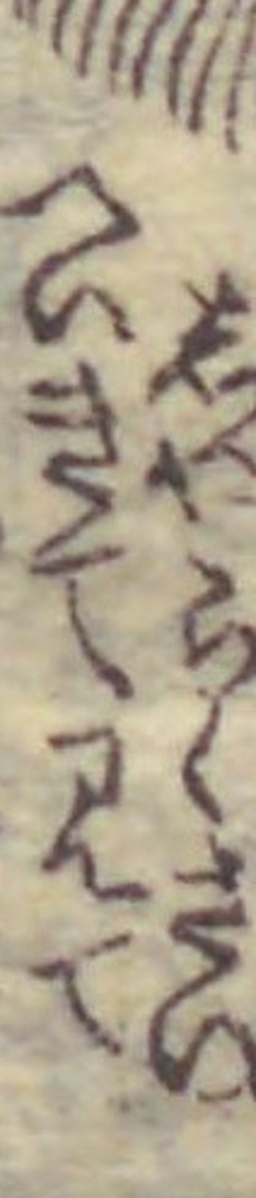へいきて見て
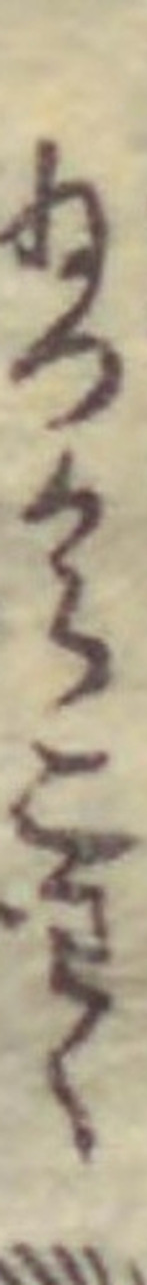ねつからこわく
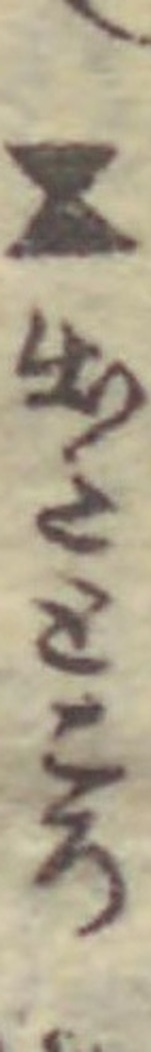▼▲出たところ
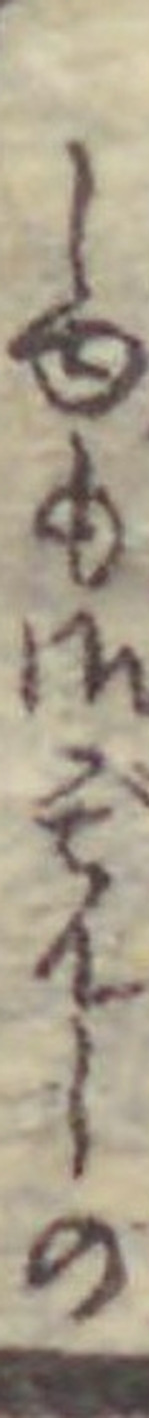しゆも御ぞんしの
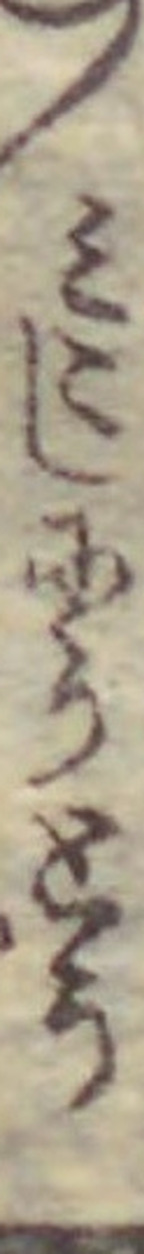みこしにうとう
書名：大時代唐土化物 3巻. 曽我太夫染
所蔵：国立国会図書館 National Diet Library, JAPAN
